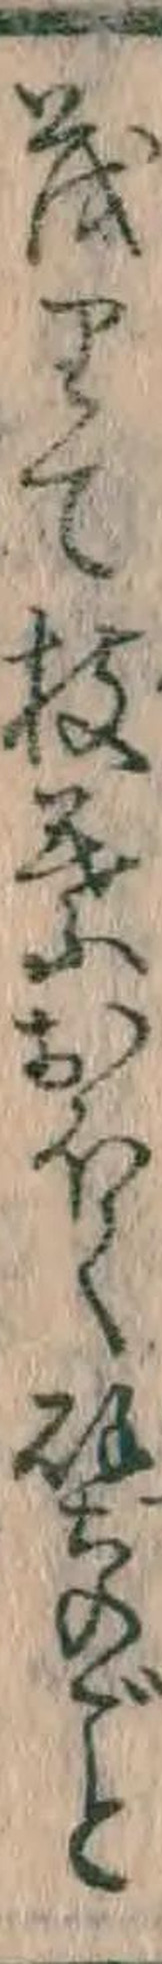茂りて枝葉おほく壁のごと
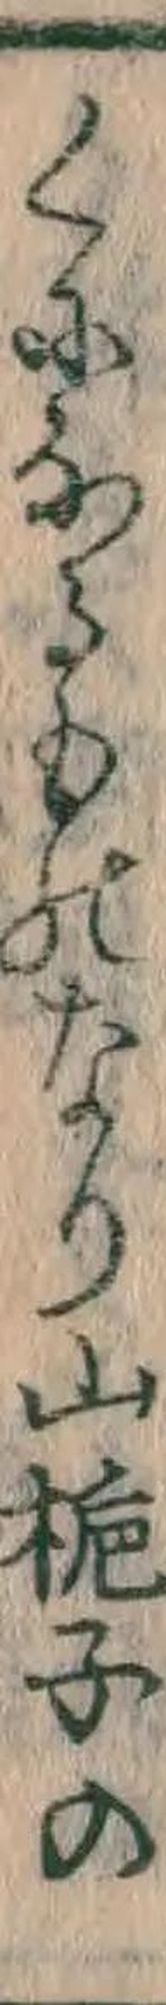くになるものなり山梔子の
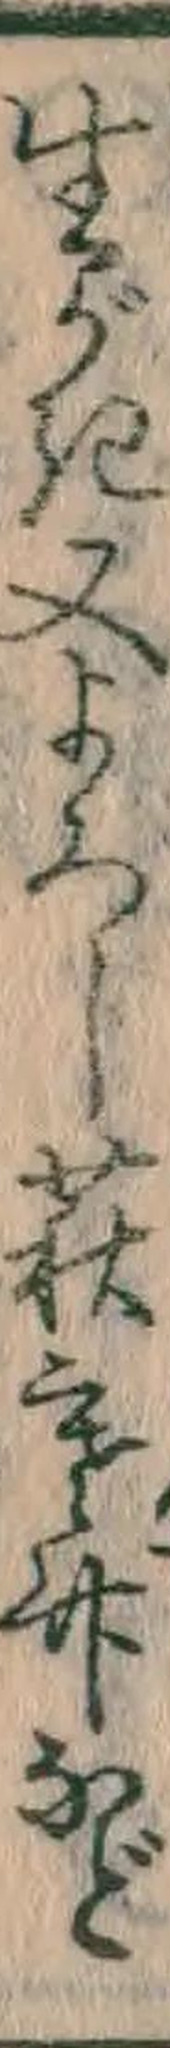生がき又よろし萩寒竹など
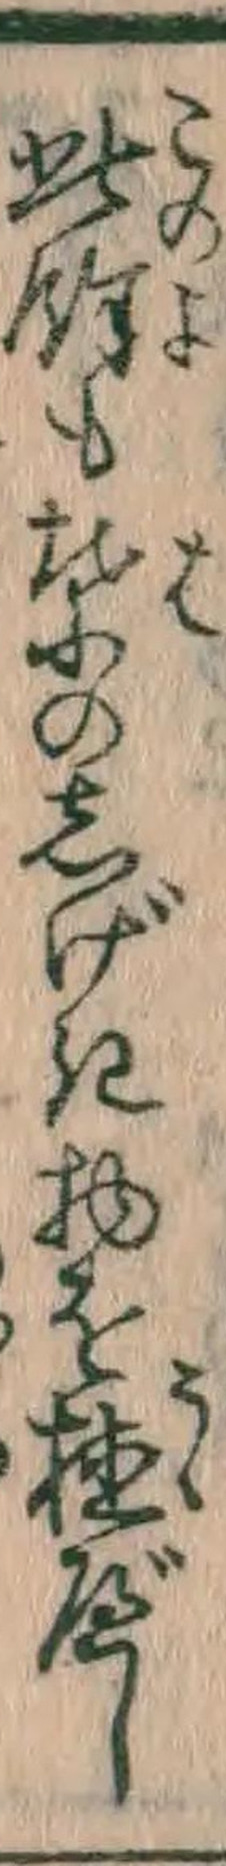此余も葉のしげき物を植べし
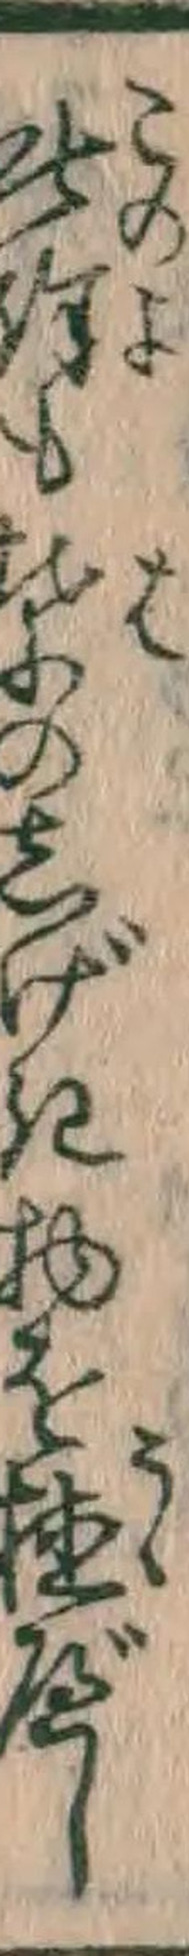此余も葉のしげき物を植べし
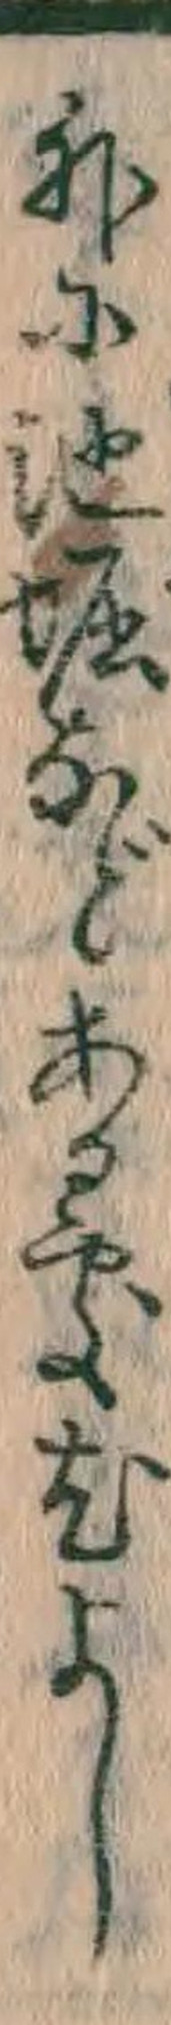外に池堀などある處尤よし
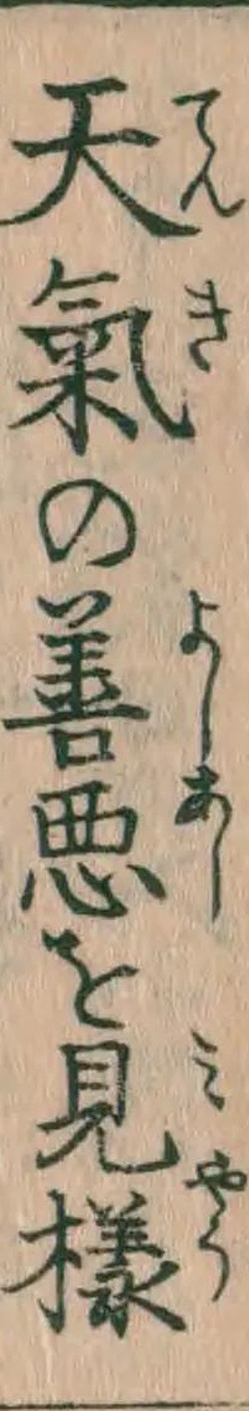天気の善悪を見様
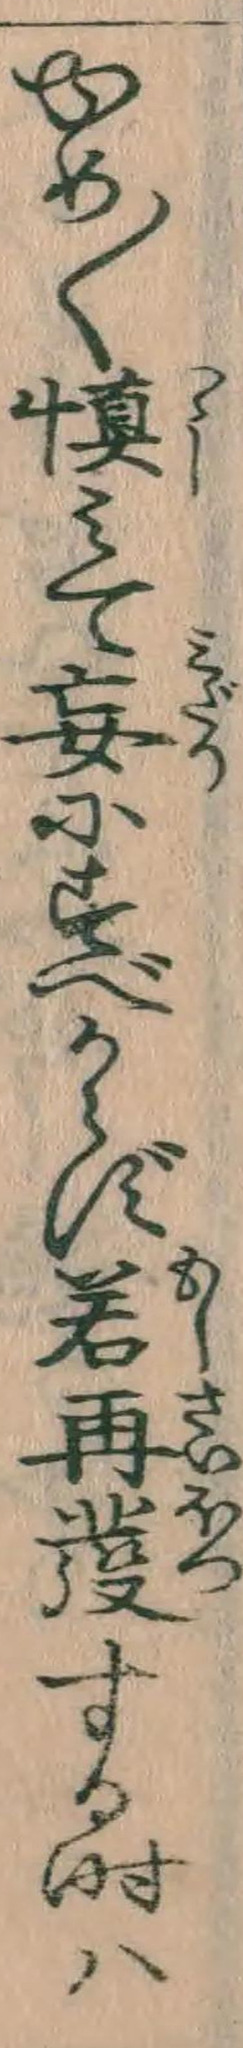ゆめ〳〵慎みて妄にすべからず若再発する時は
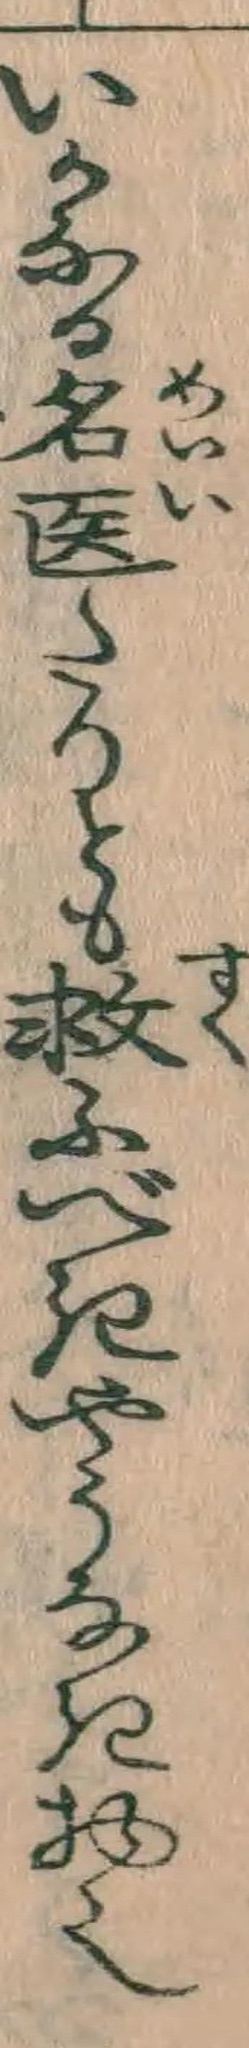いかなる名医たりとも救ふべきやうなき物也
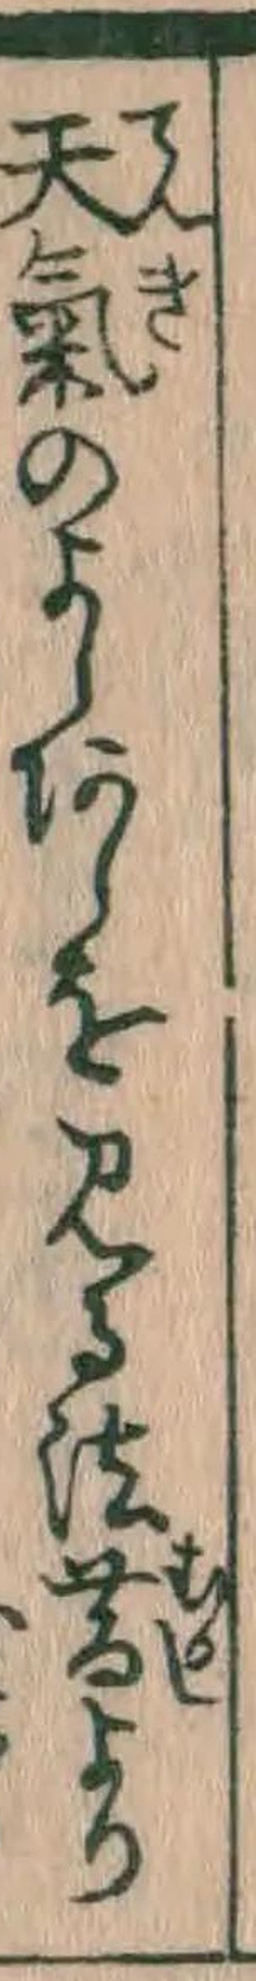天気のよしあしを見る法昔より
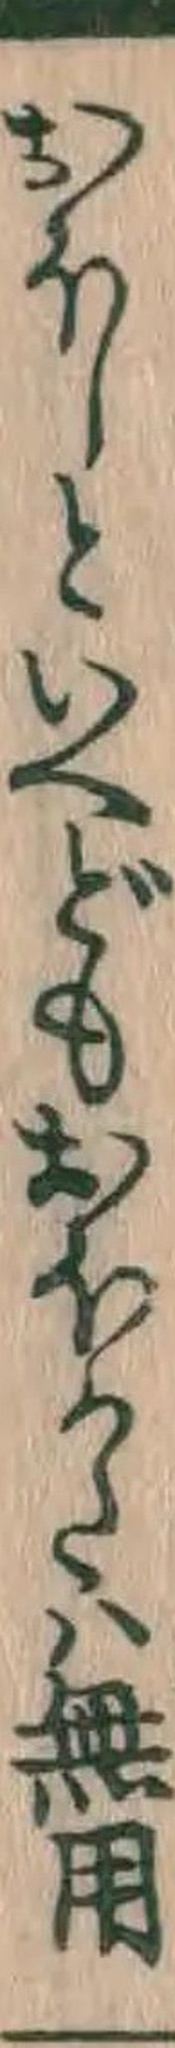おほしといへどもおほかたは無用
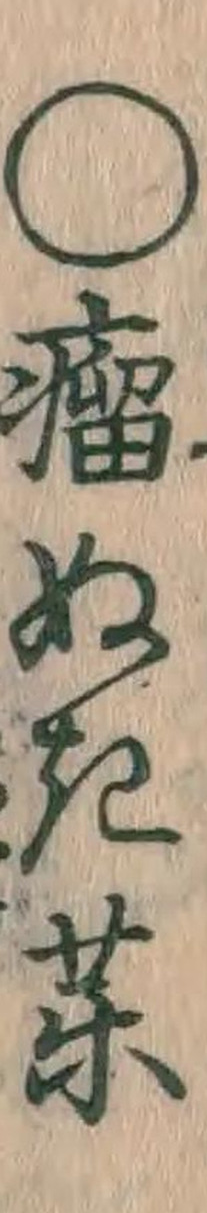○瘤ぬき薬
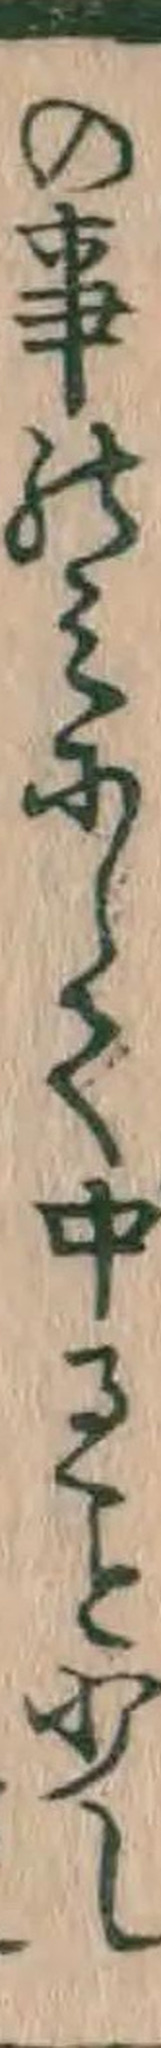の事のみにして中ること少し
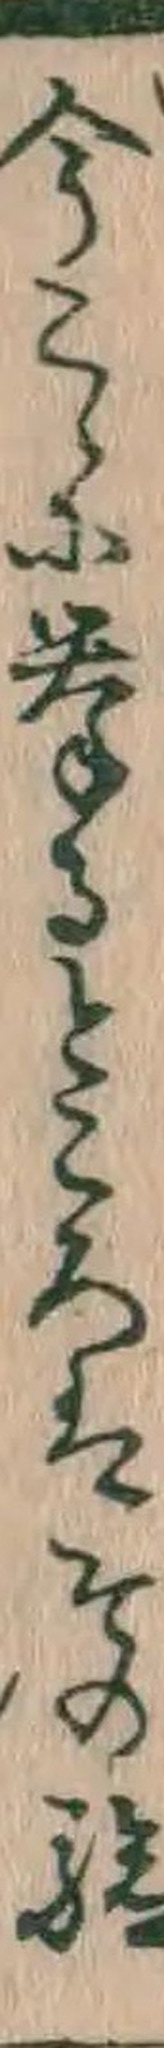今こゝに挙るところはその験
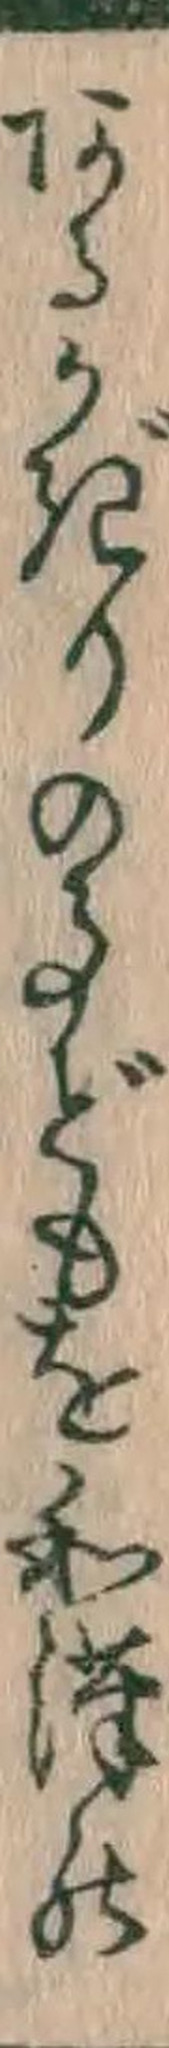あるかぎりの事どもを和漢の
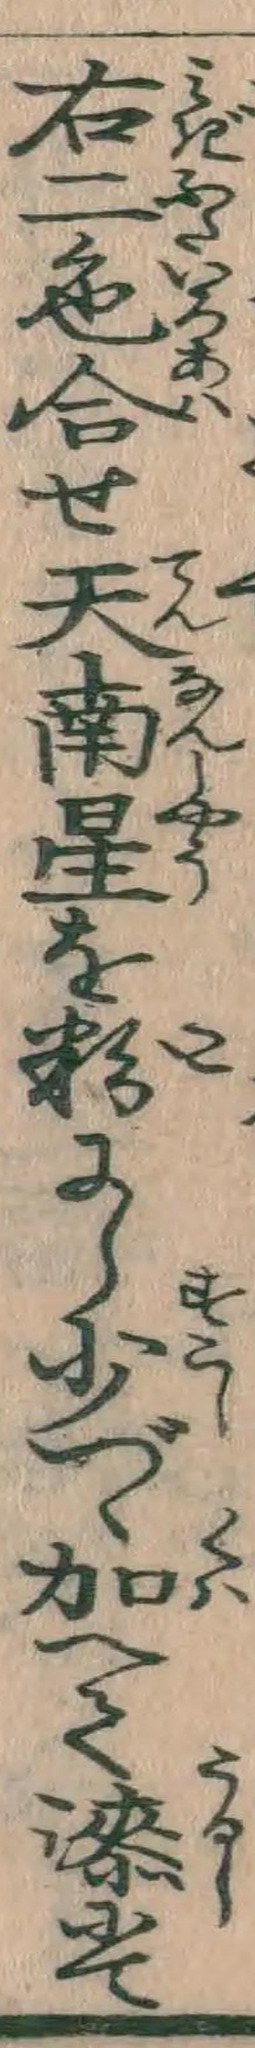右二色合せ天南星を粉にし少づゝ加へて漆にて
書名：広益秘事大全 3巻. [3]
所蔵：国立国会図書館 National Diet Library, JAPAN
